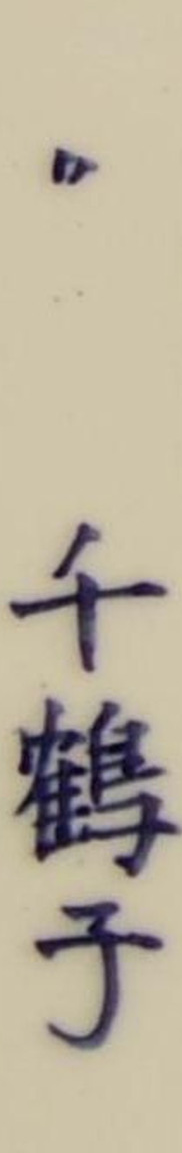千鶴子
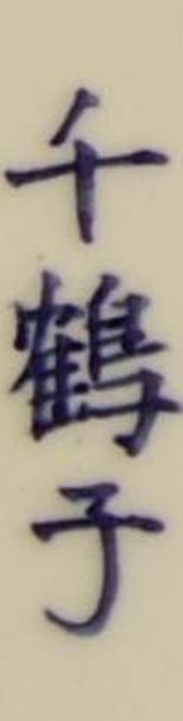千鶴子

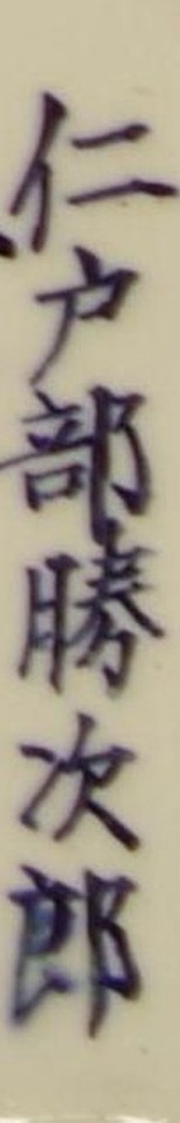仁戸部勝次郎
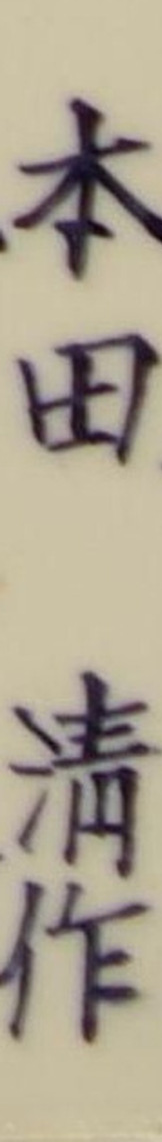本田清作
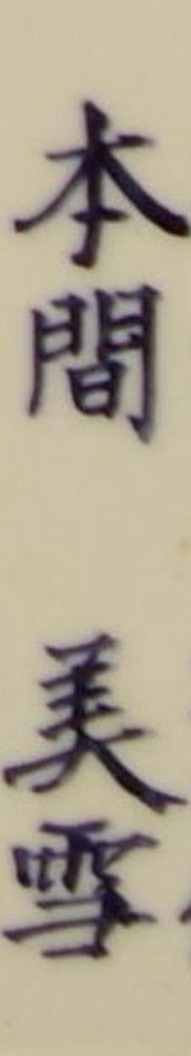本間美雪
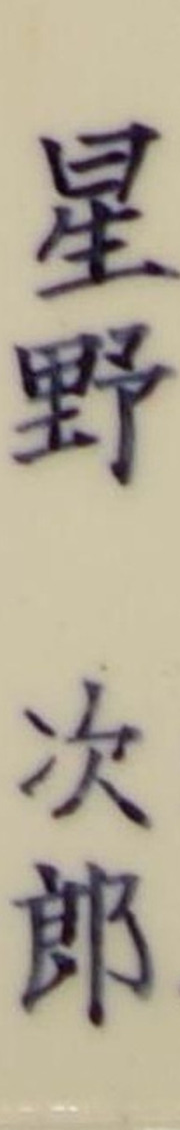星野次郎
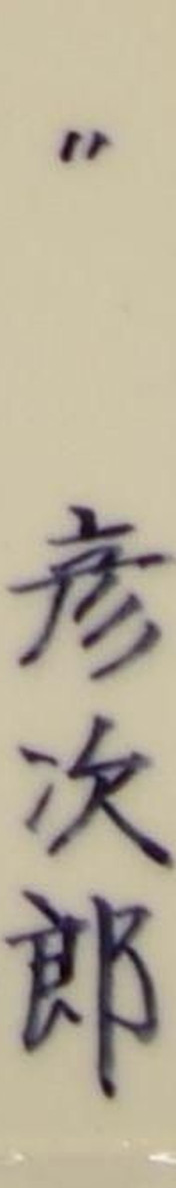彦次郎
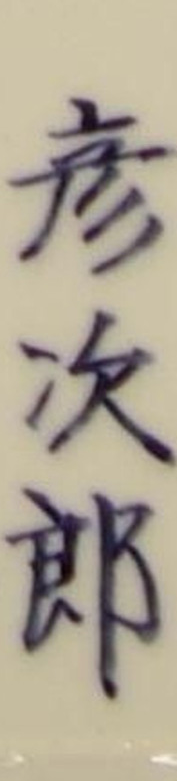彦次郎
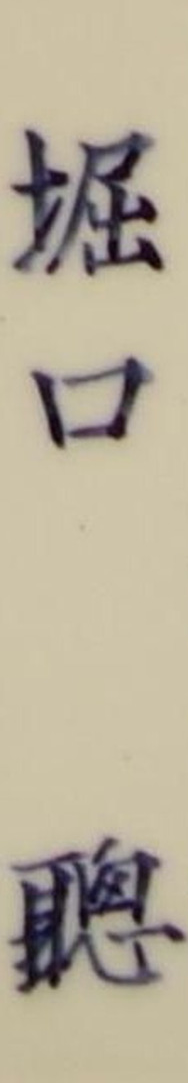堀口聰
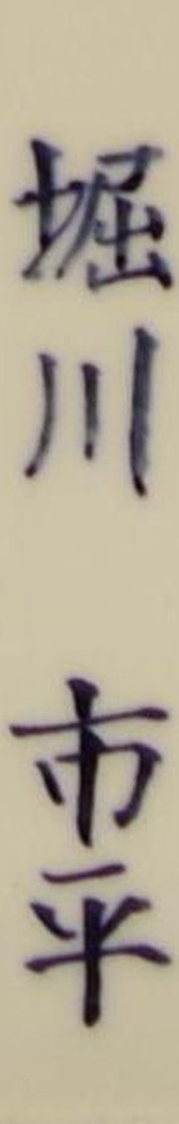堀川市平
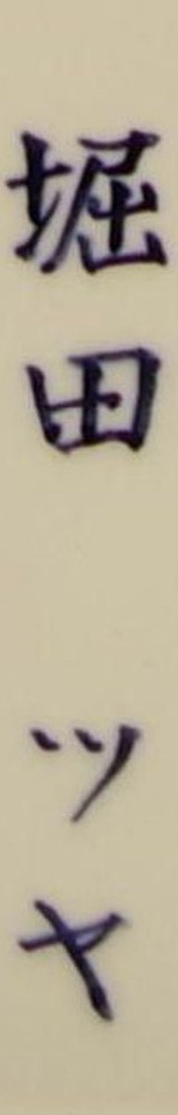堀田ツヤ
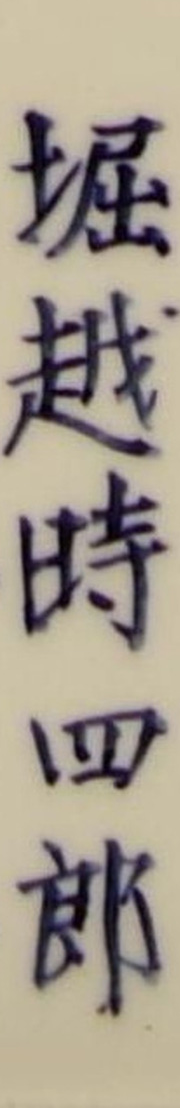堀越時四郎
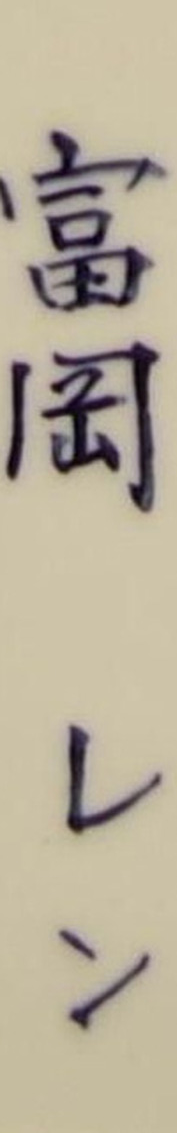富岡レン
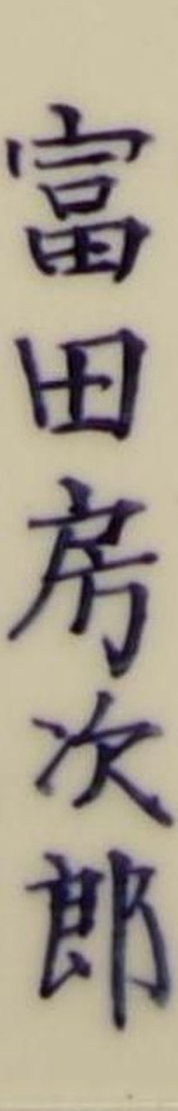富田房次郎
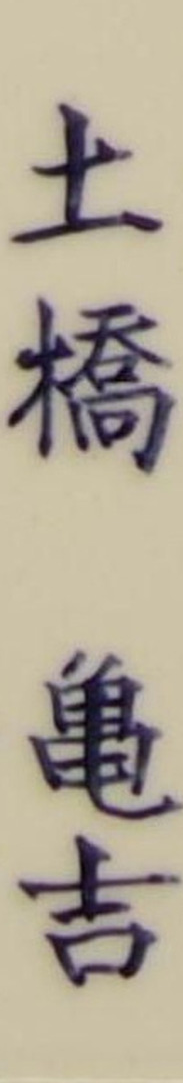土橋亀吉
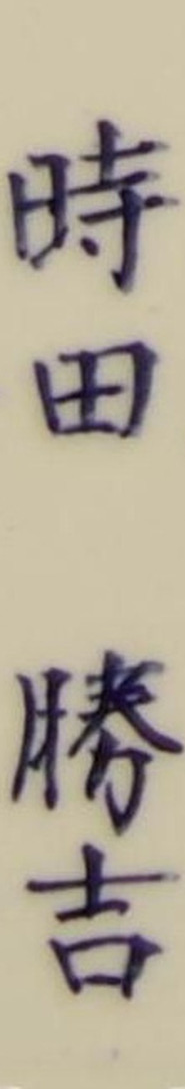時田勝吉
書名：E~L
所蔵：高野山金剛峯寺
